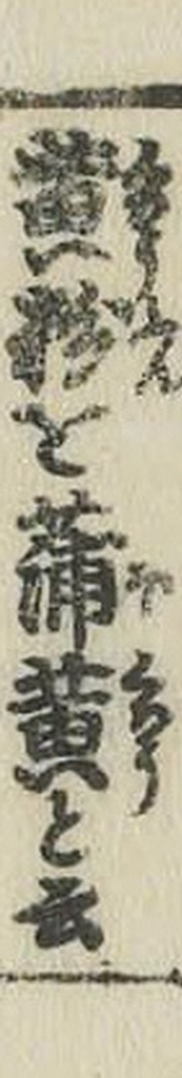黄粉を蒲黄と云
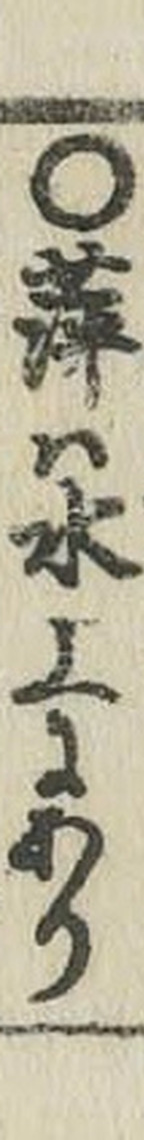○萍は水上にあり
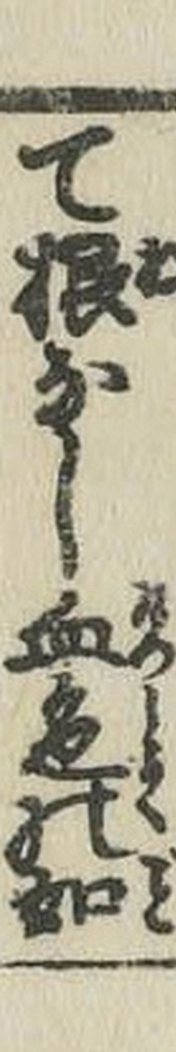て根なし血色の如

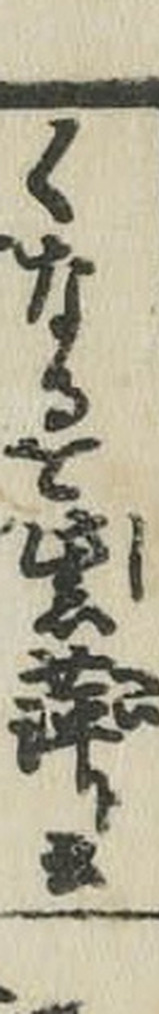くなるを紫萍ト云
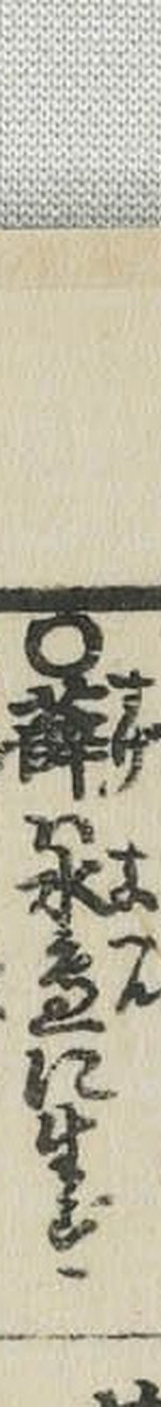○薛は水辺に生ず
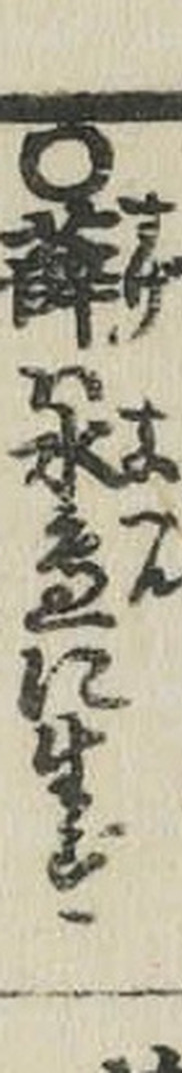○薛は水辺に生ず
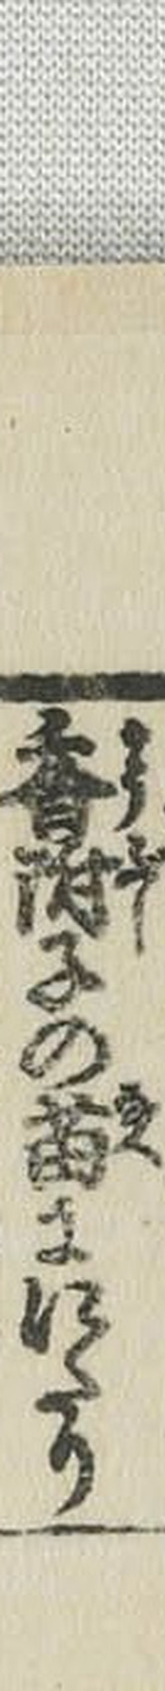香附子の苗ににたり
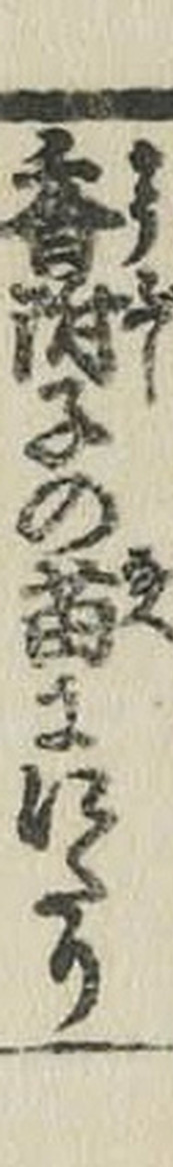香附子の苗ににたり
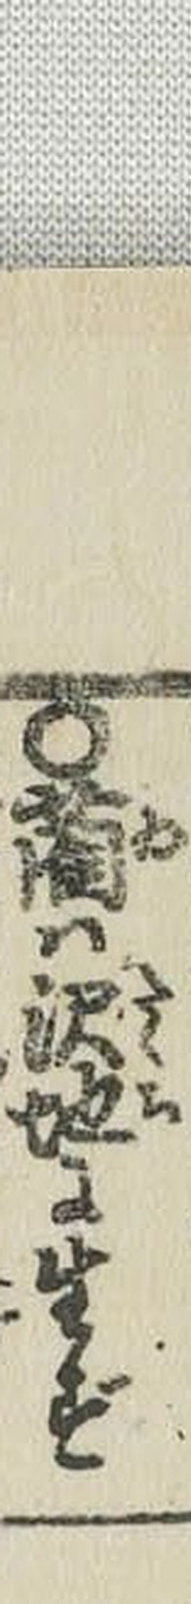○藺は沢地に生ず
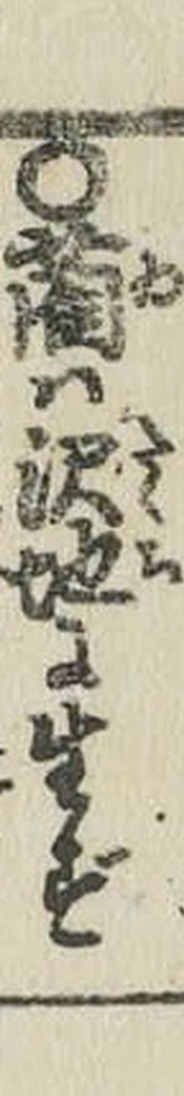○藺は沢地に生ず
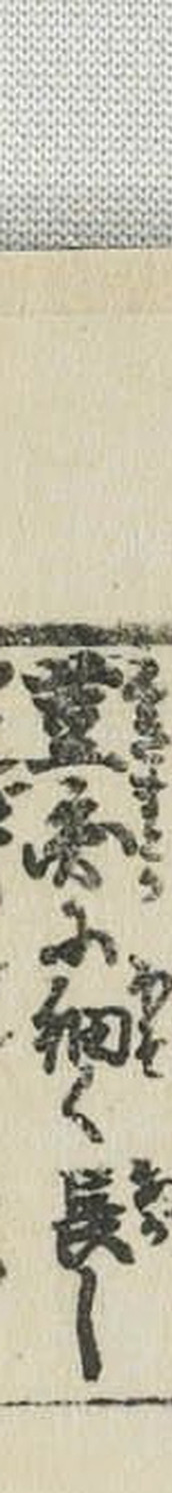茎円に細く長し
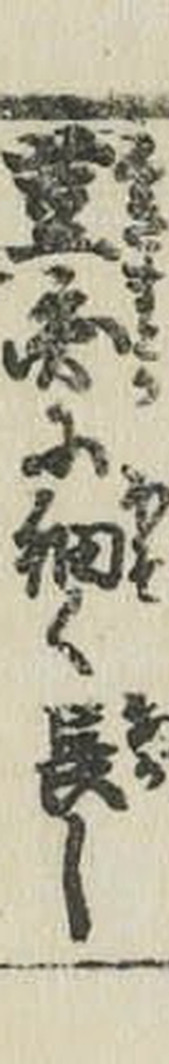茎円に細く長し
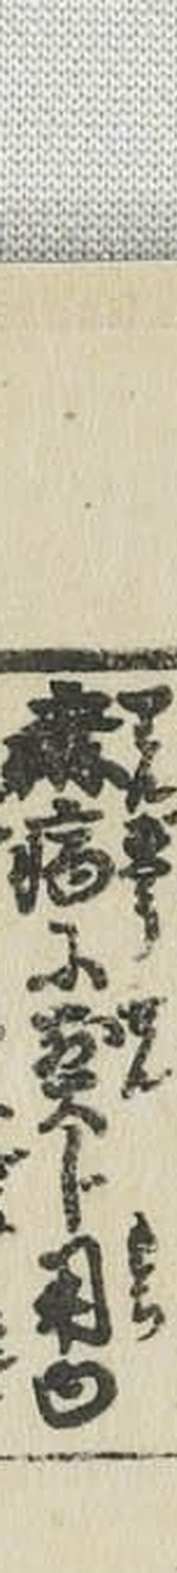痳病に煎じ用ゆ
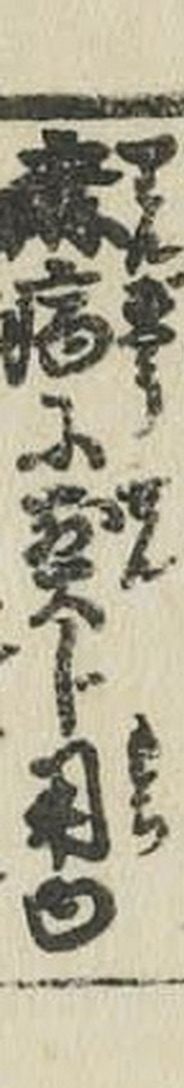痳病に煎じ用ゆ
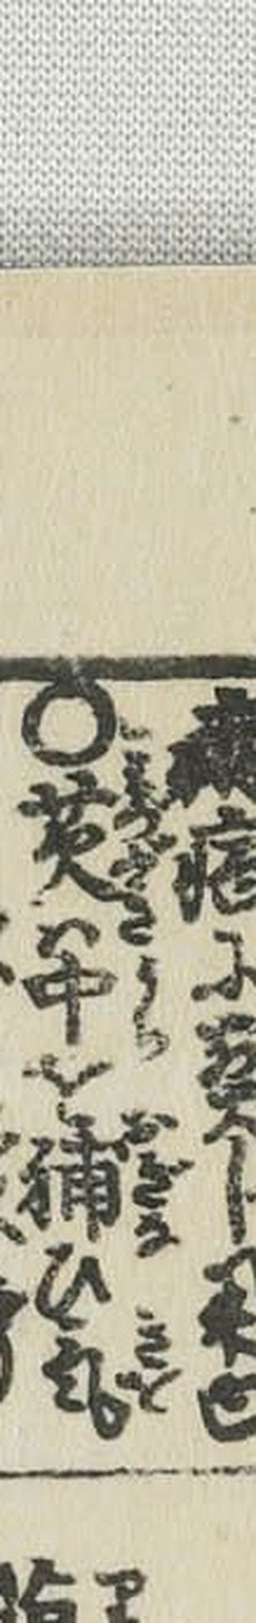○芡は中を補ひ気
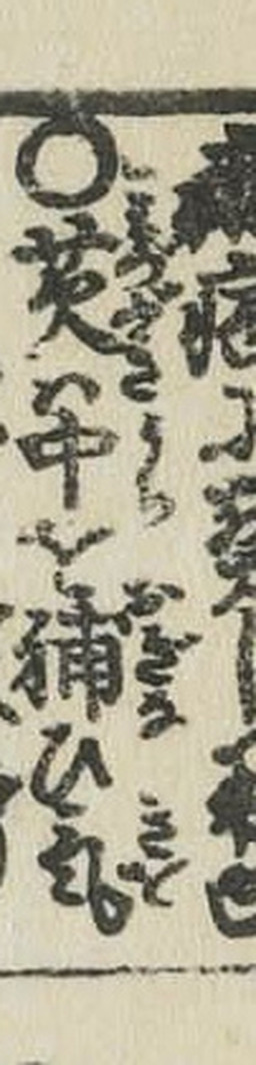○芡は中を補ひ気
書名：増補頭書訓蒙図彙大成 10巻 9:巻之20
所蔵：東京学芸大学教育コンテンツアーカイブ
